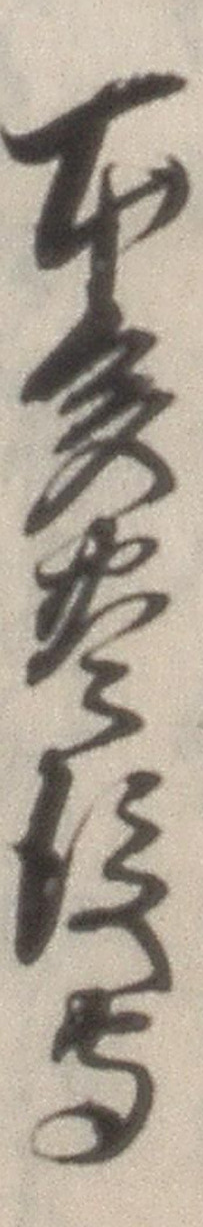本多豊後守
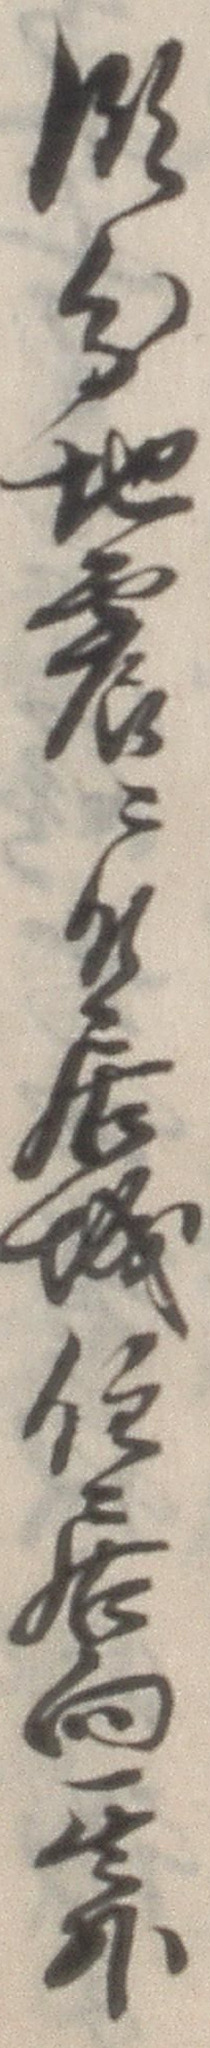領分地震二付居城住居向其外
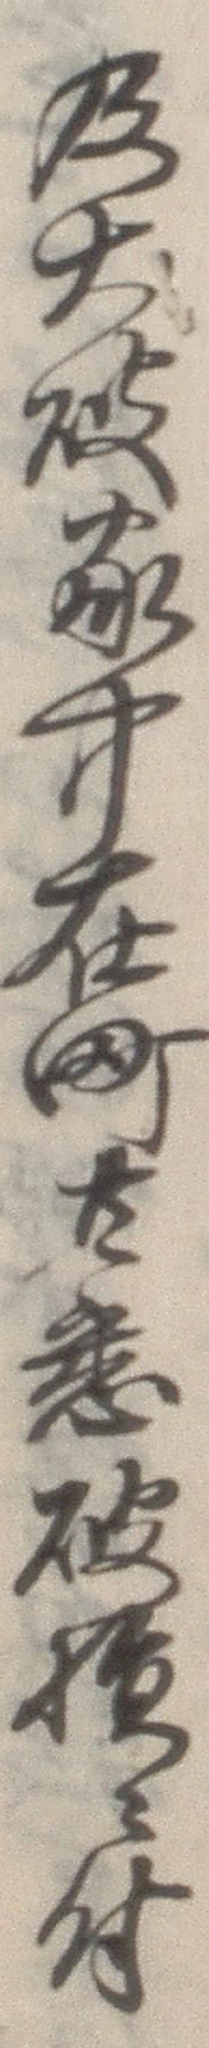及大破家中在町共悉破損二付
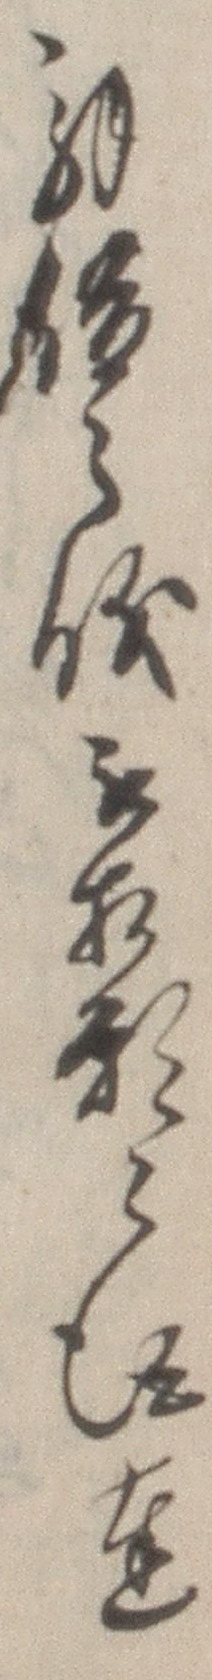拝借之儀被相願候趣達
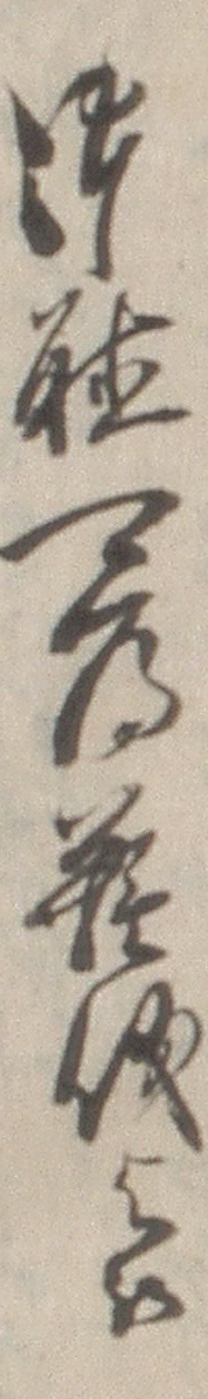御聴可為難儀と被
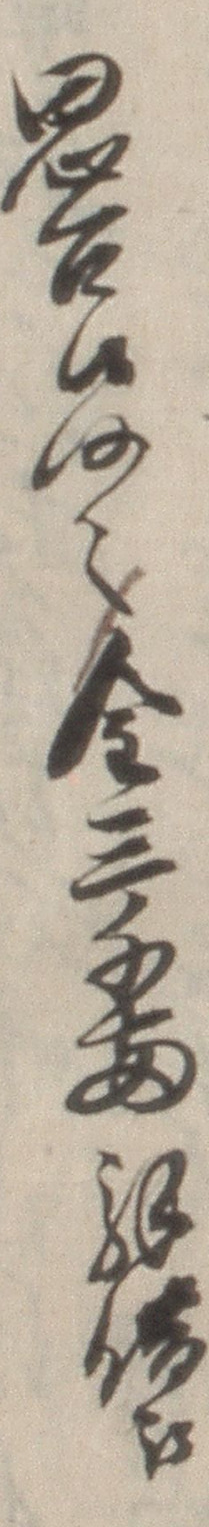思召候仍之金三千両拝借被
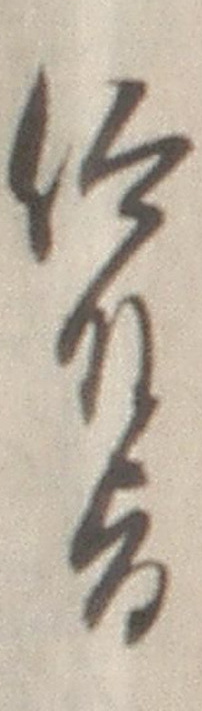仰付旨
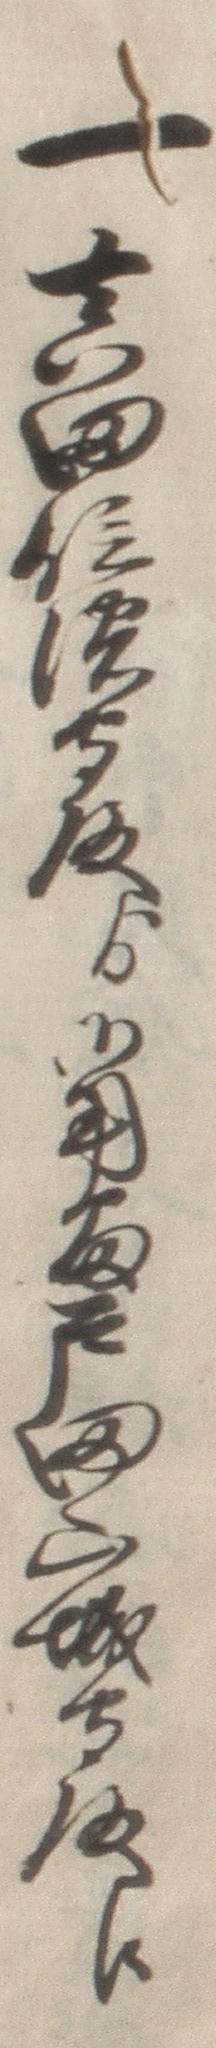一真田信濃守殿ゟ御用番戸田山城守殿江
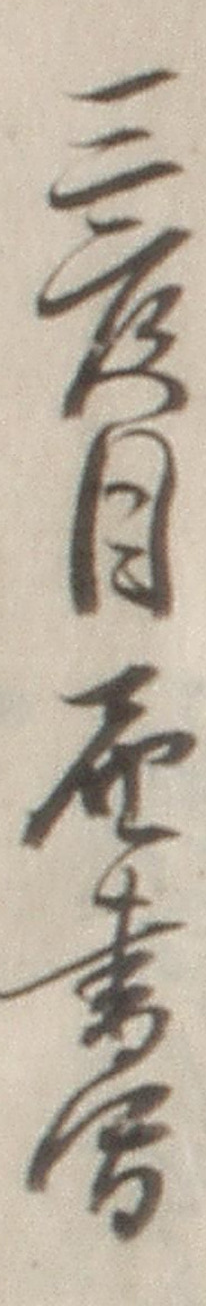三度目届書写
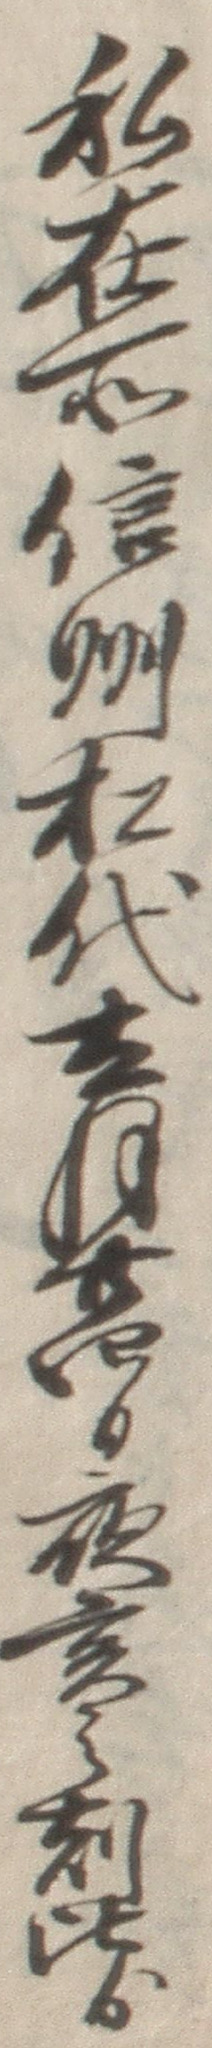私在所信州松代去付廿四日夜亥之刻比ゟ
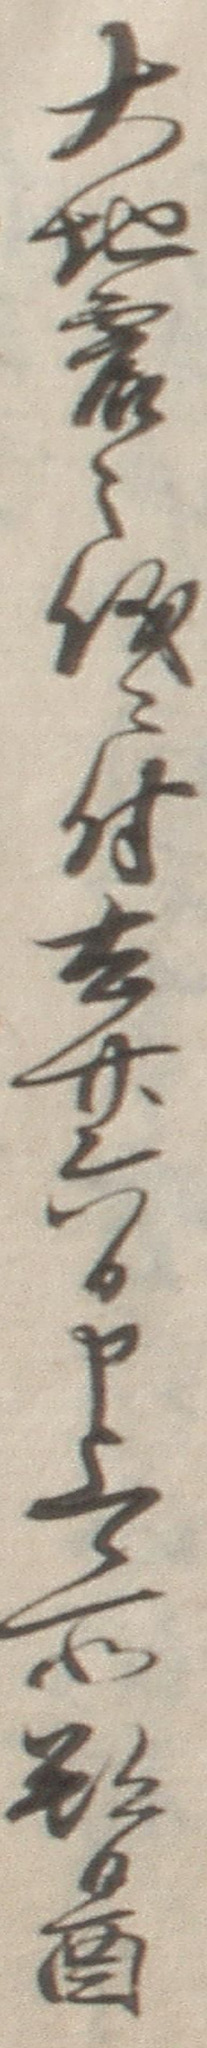大地震之儀二付去廿六日申上候所朔日酉
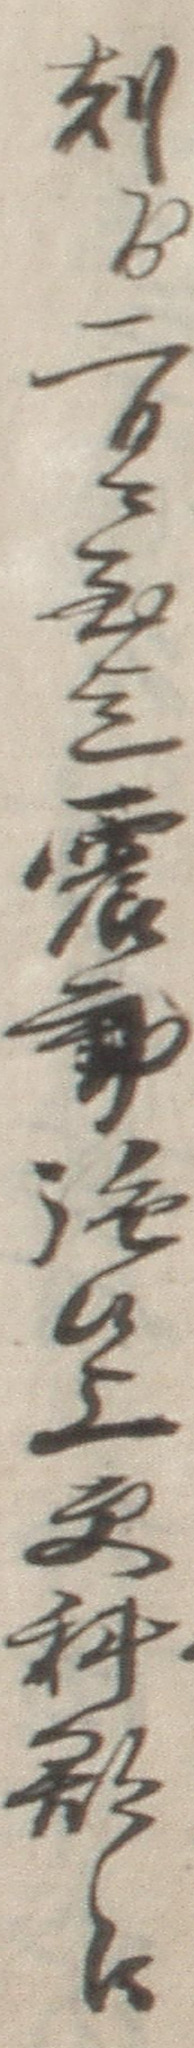刻ゟ二日二至迄震動強候上更級郡江

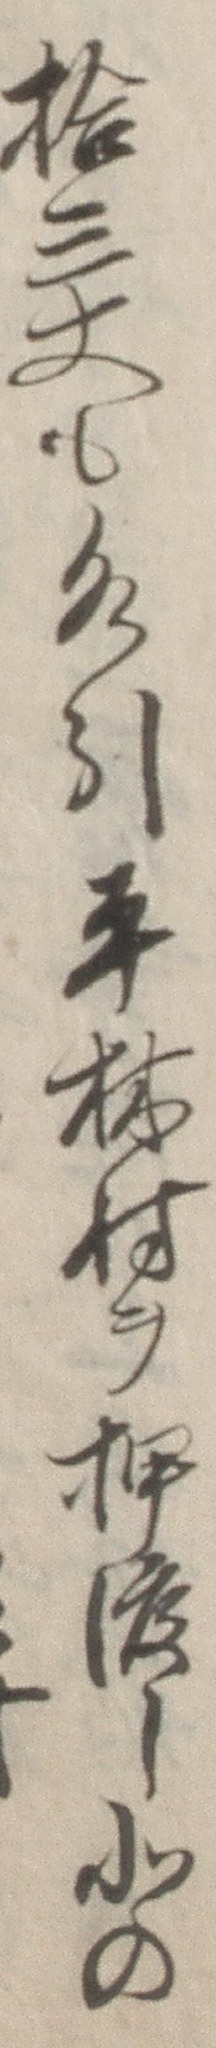拾三丈も水引平林村ヲ押流し北の
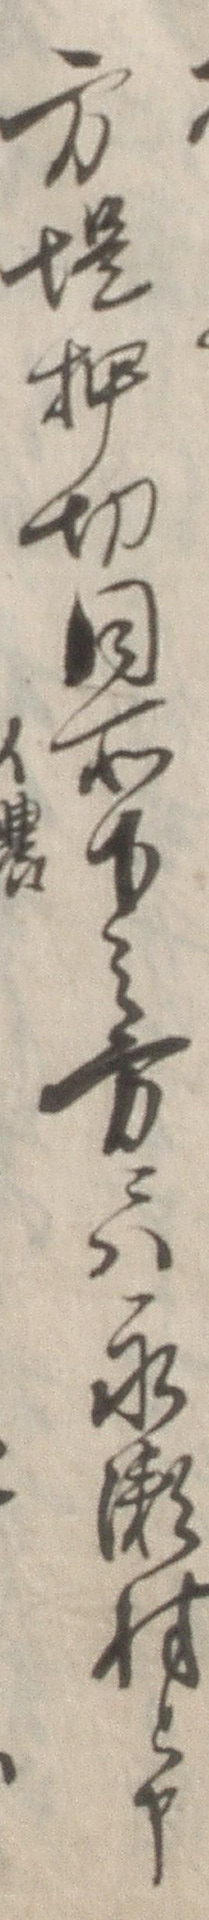方堰押切同所下之方二ハ永瀬村と申
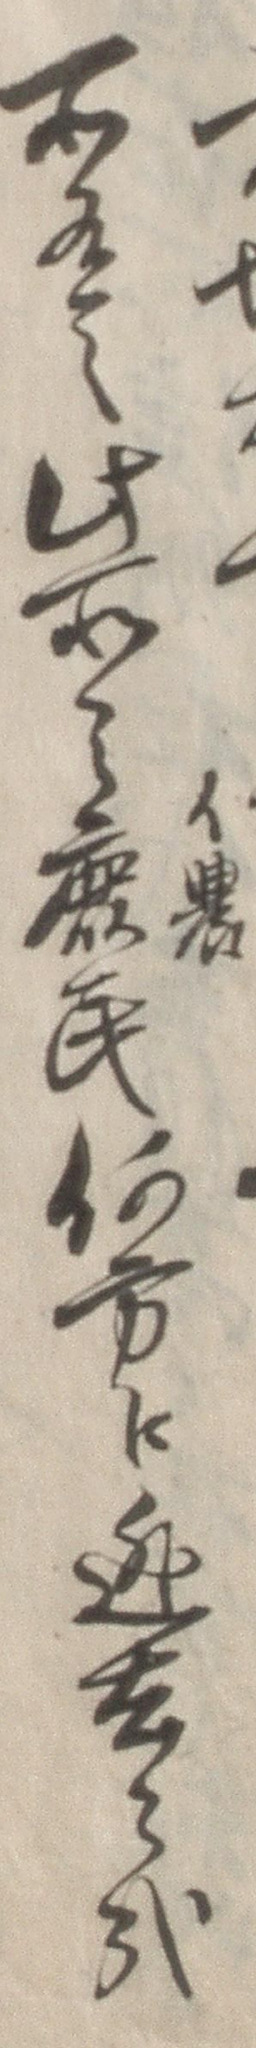所有之此所之農民何方江逃去候哉
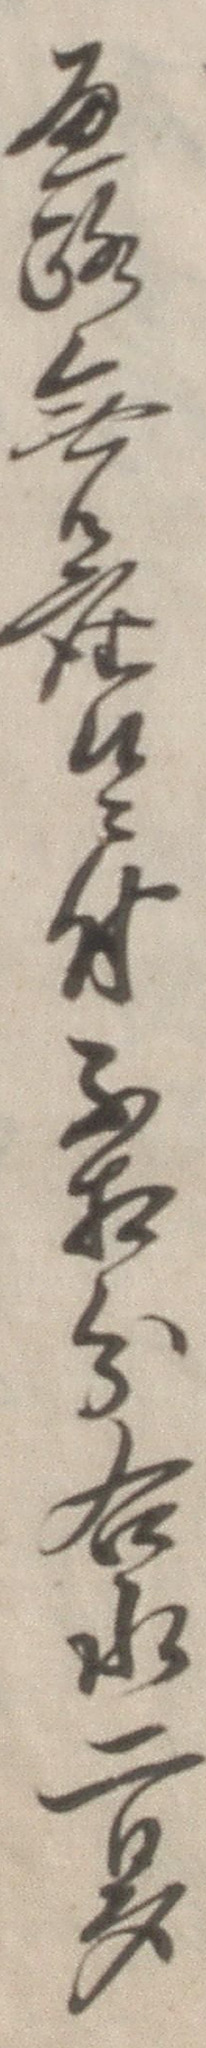通路無之御座候二付不相分右水二日夕
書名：信州地震一件
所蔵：東京大学地震研究所図書室 Earthquake Research Institute Library, The University of Tokyo, JAPAN
